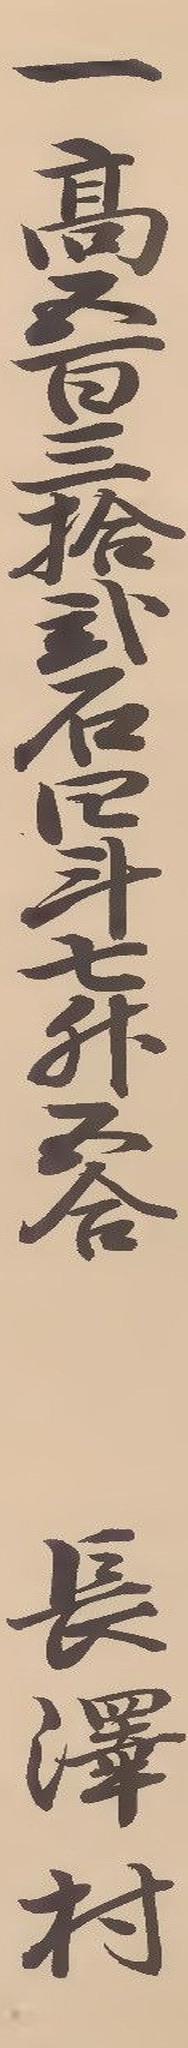一高五百三拾弐石四斗七升五合長澤村
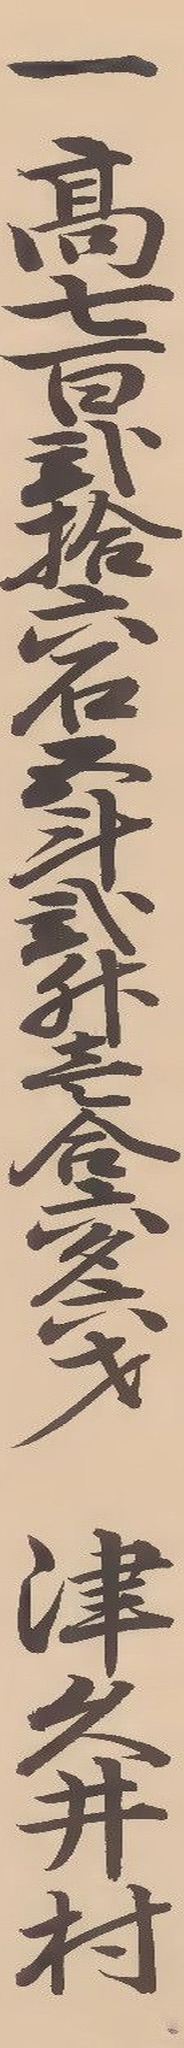一高七百弐拾六石五斗弐升壱合六勺六才津久井村
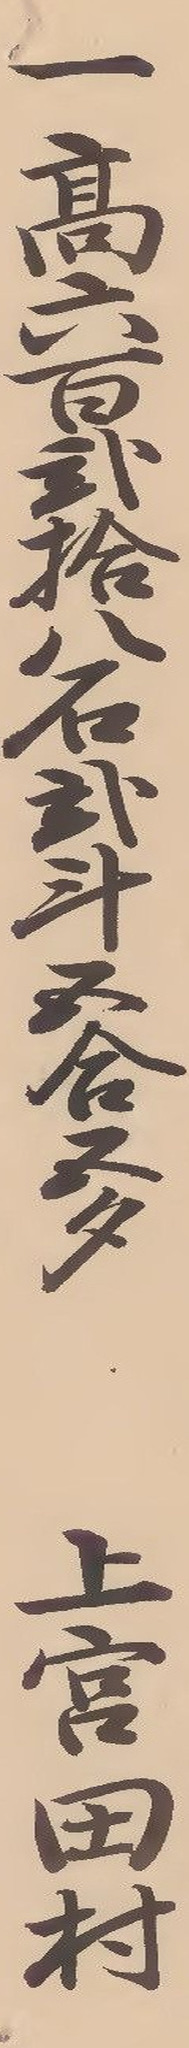一高六百弐拾八石弐斗五合五勺上宮田村
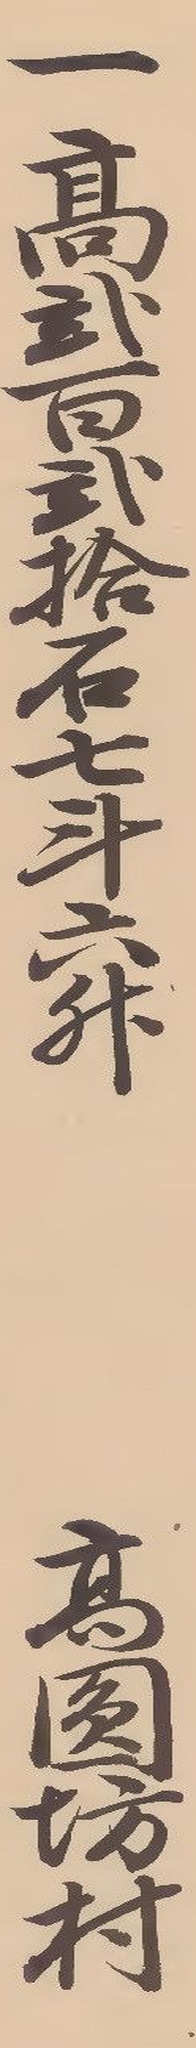一高弐百弐拾石七斗六升高圓坊村

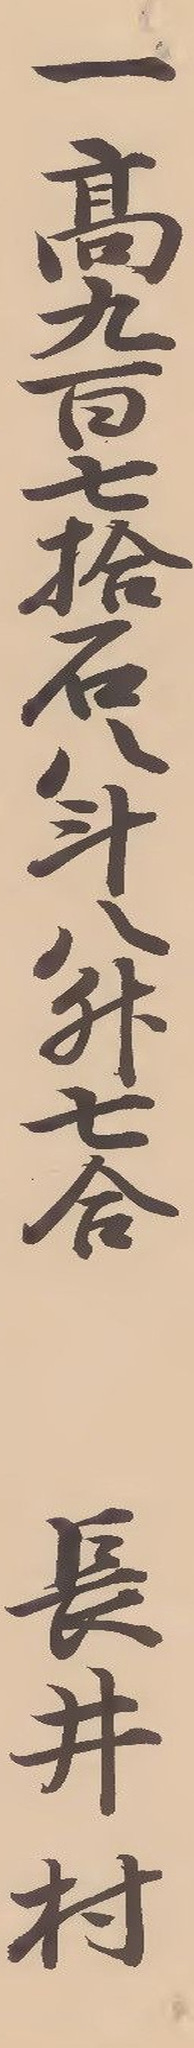一高九百七拾石八斗八升七合長井村
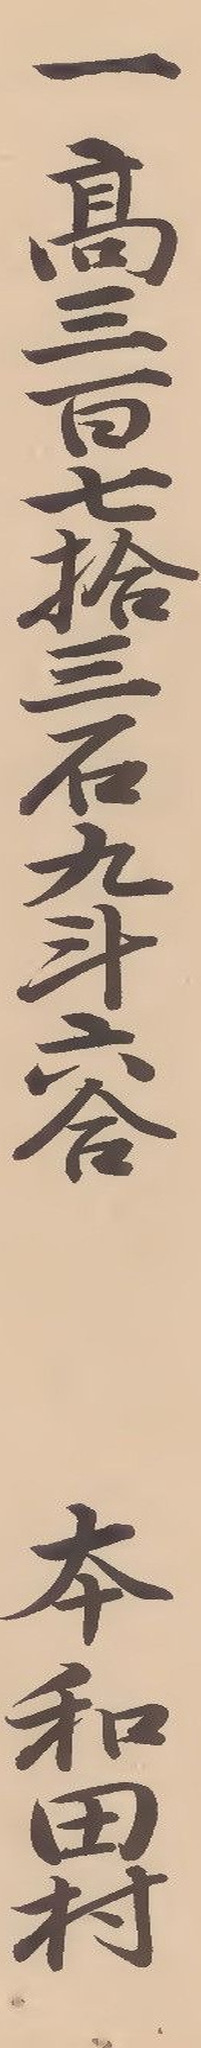一高三百七拾三石九斗六合本和田村
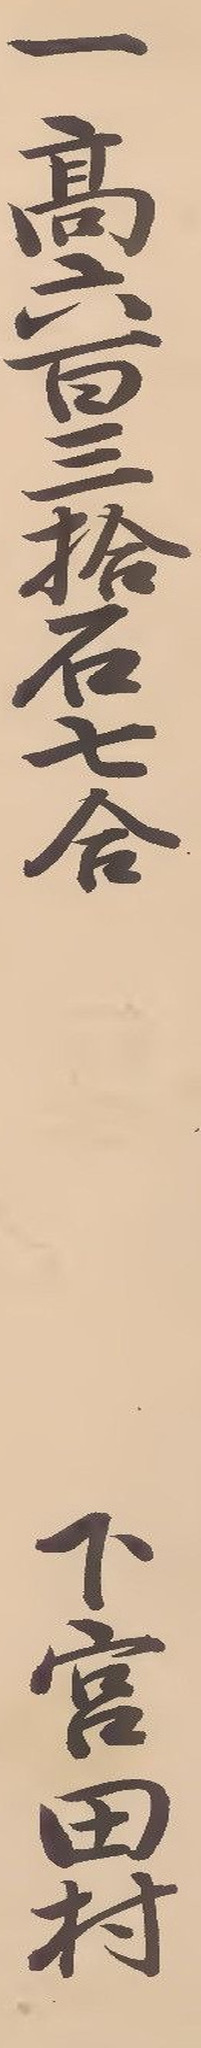一高六百三拾石七合下宮田村
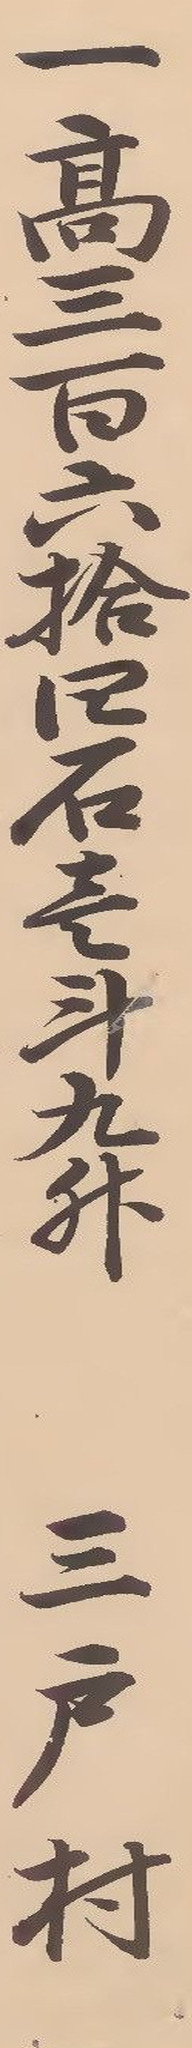一高三百六拾四石壱斗九升三戸村
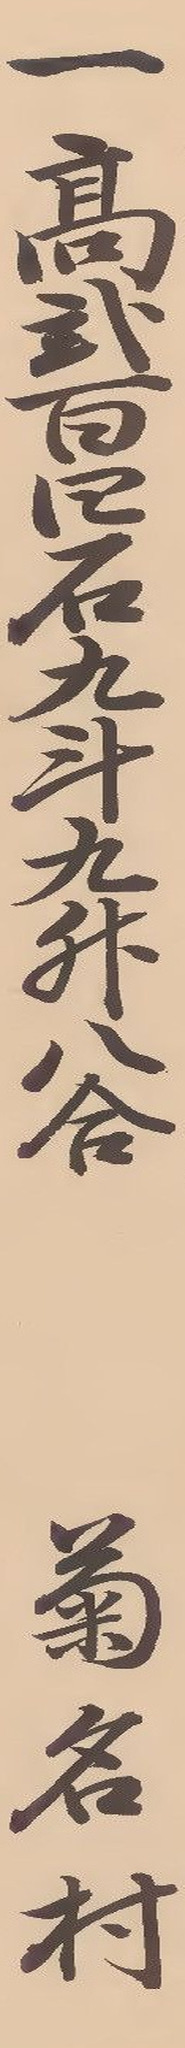一高弐百四石九斗九升八合菊名村

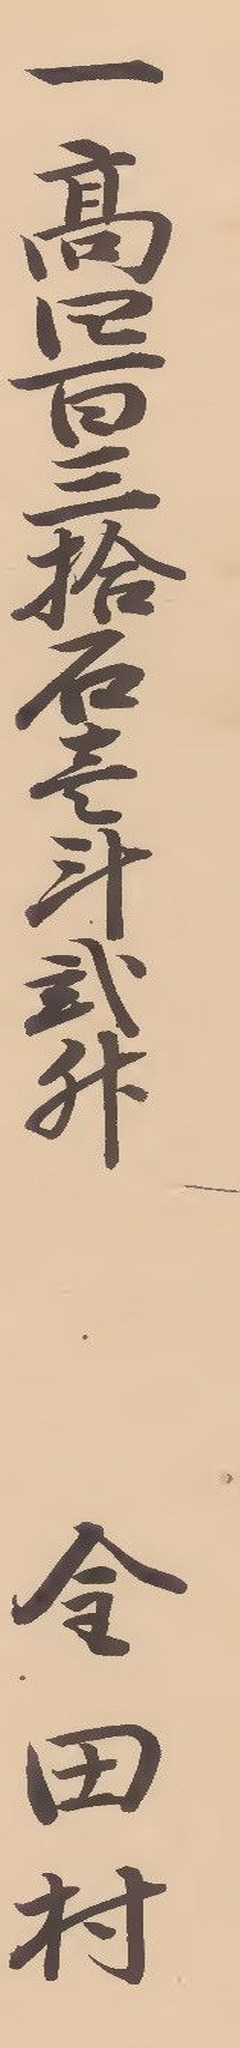一高四百三拾石壱斗弐升金田村
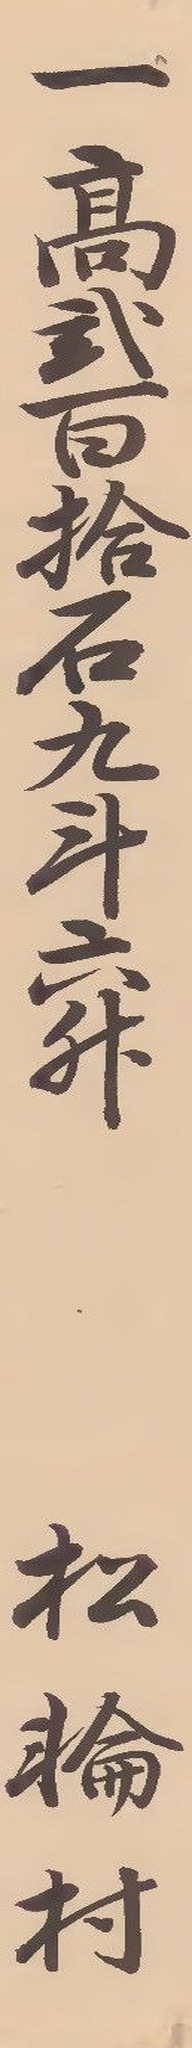一高弐百拾石九斗六升松輪村
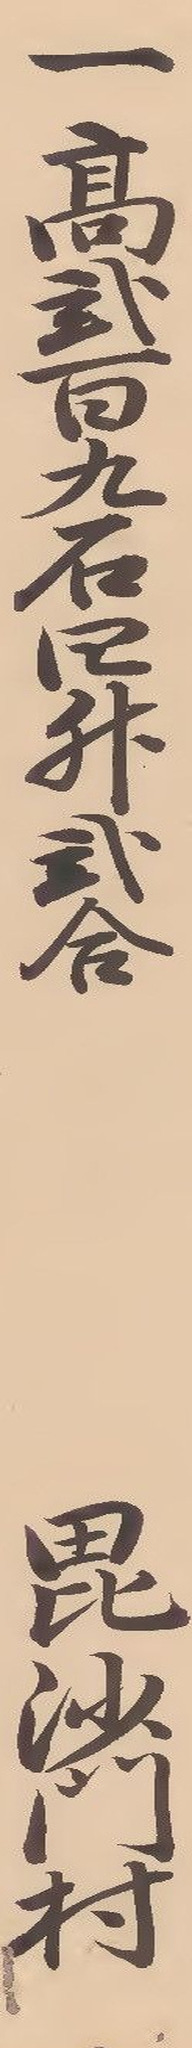一高弐百九石四升弐合毘沙門村
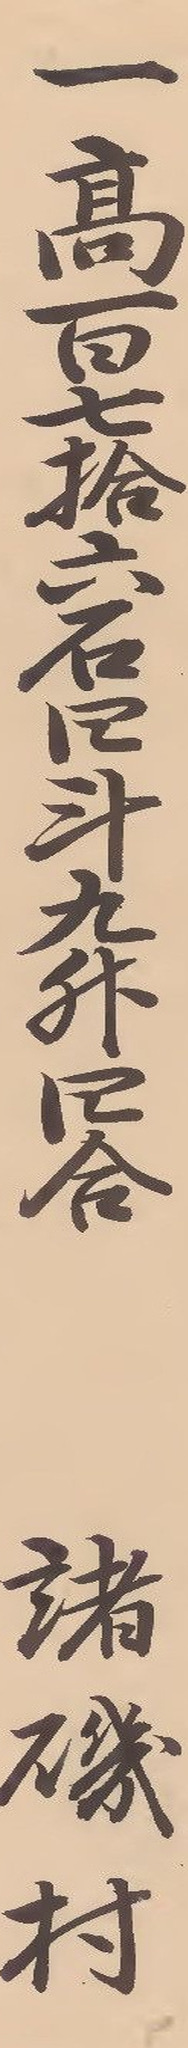一高百七拾六石四斗九升四合諸磯村
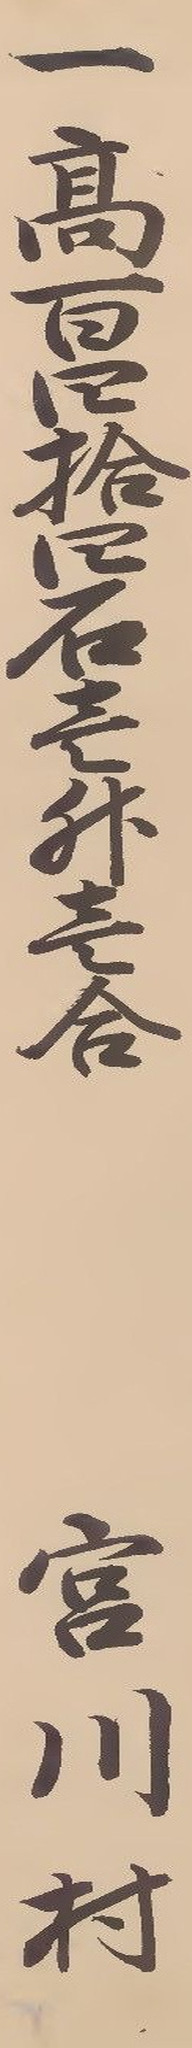一高百四拾四石壱升壱合宮川村
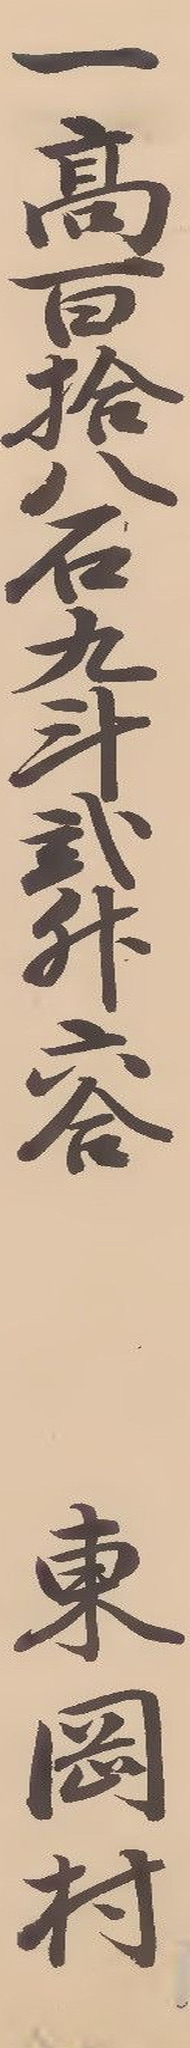一高百拾八石九斗弐升六合東岡村
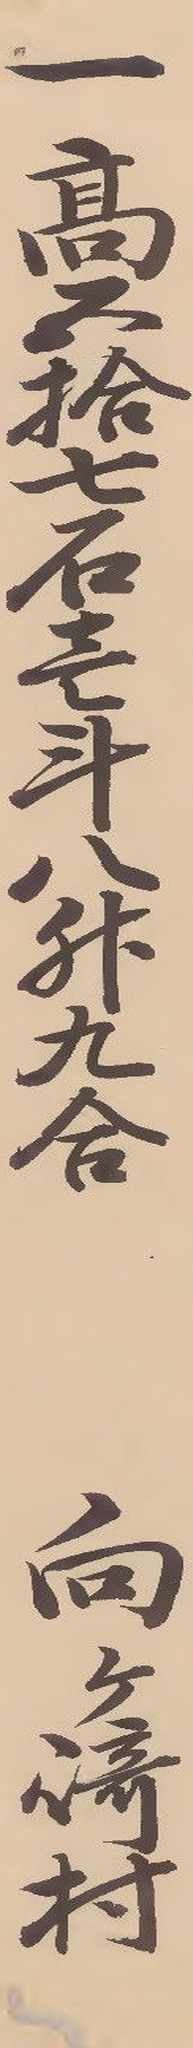一高五拾七石壱斗八升九合向ヶ崎村
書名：相模国郷帳
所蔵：国立公文書館 National Archives of Japan
